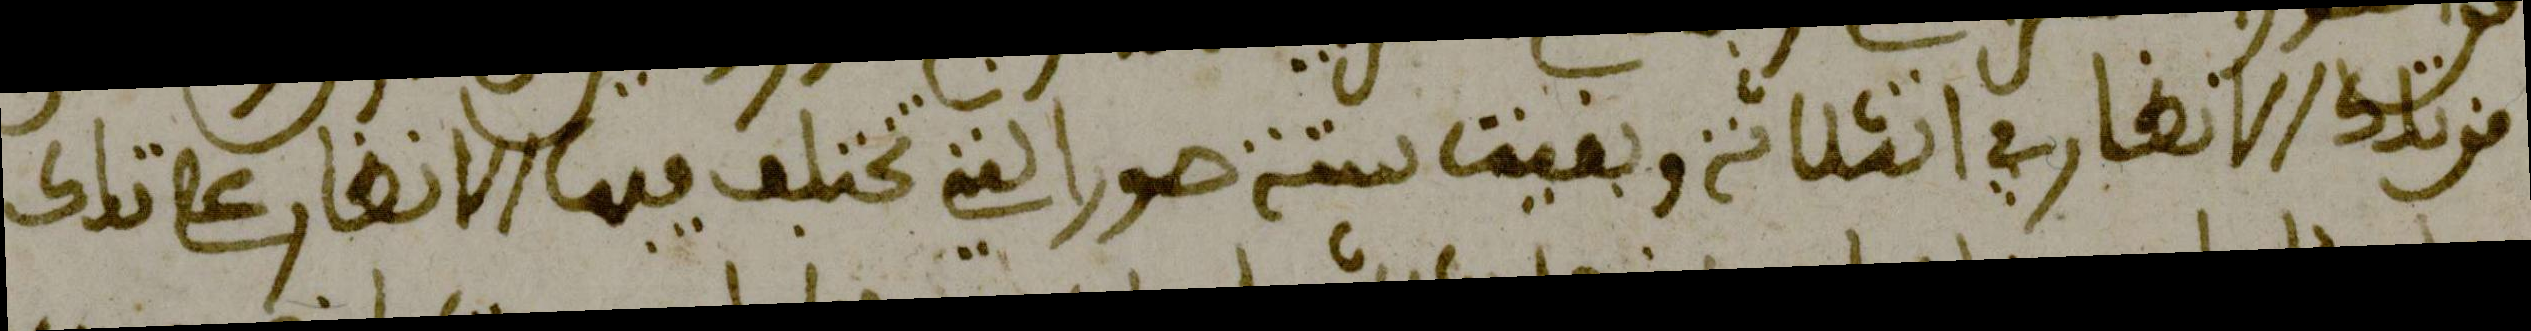من تلك الانظار في الثلاثة وبقيت ستة صور التي تختلف فيها الانظار على تلك
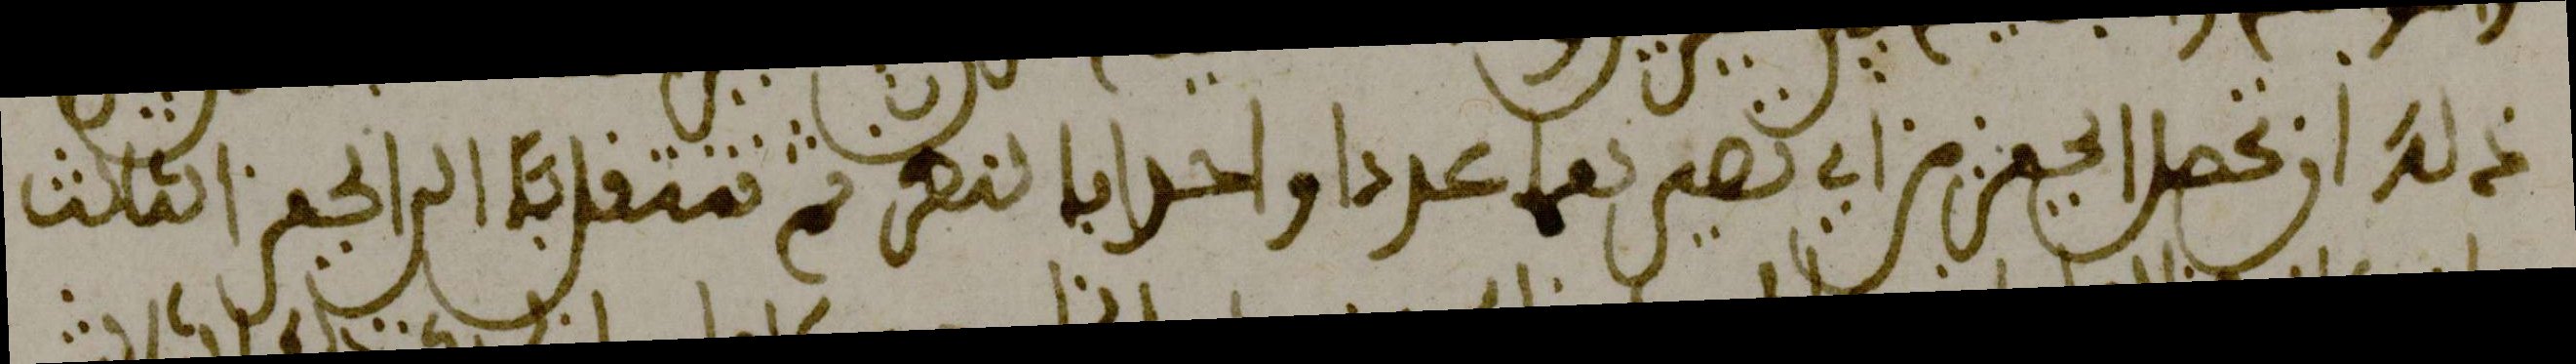ذلك ان تحصل الحيزين اي تصيرهما عددا واحدا بالنظر ثم تنتقل الى الحيز الثالث
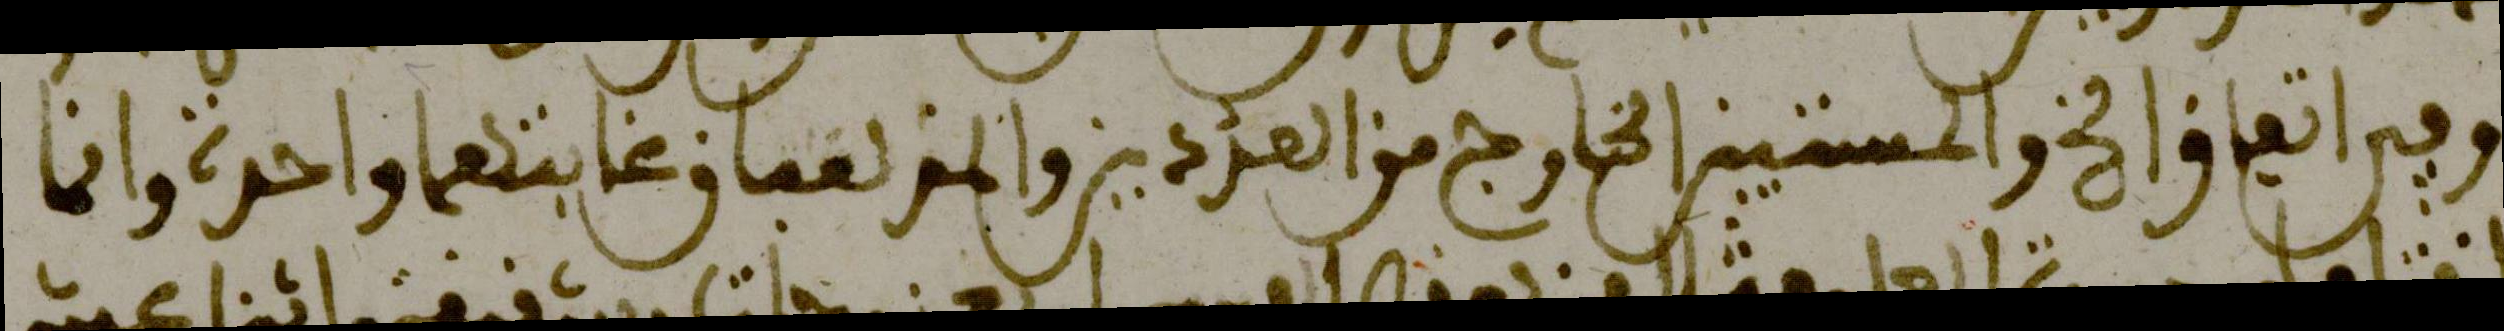وفي اتفاق الخ والمستبين الخارج من العددين والمذهبان غايتهما واحدة وانما
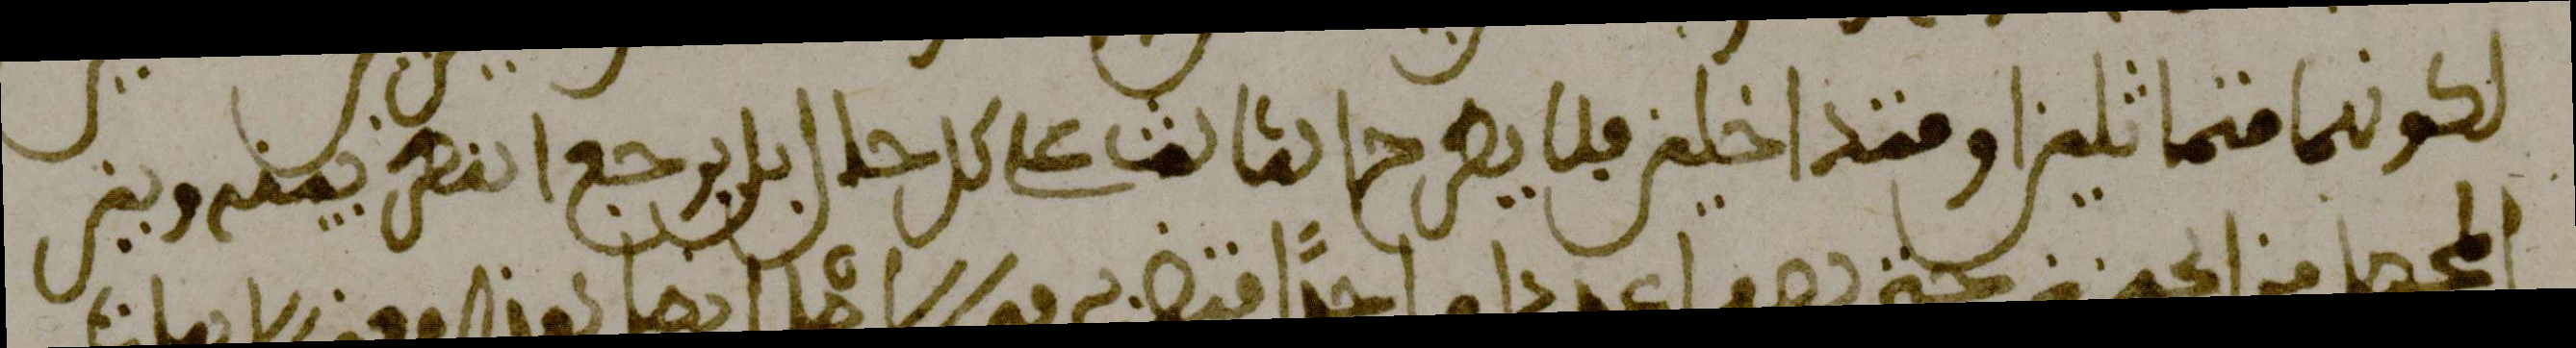لكونها متماثلين او متداخلين فلا يطرح الثالث على كل حال بل يرجع النظر بينه وبين
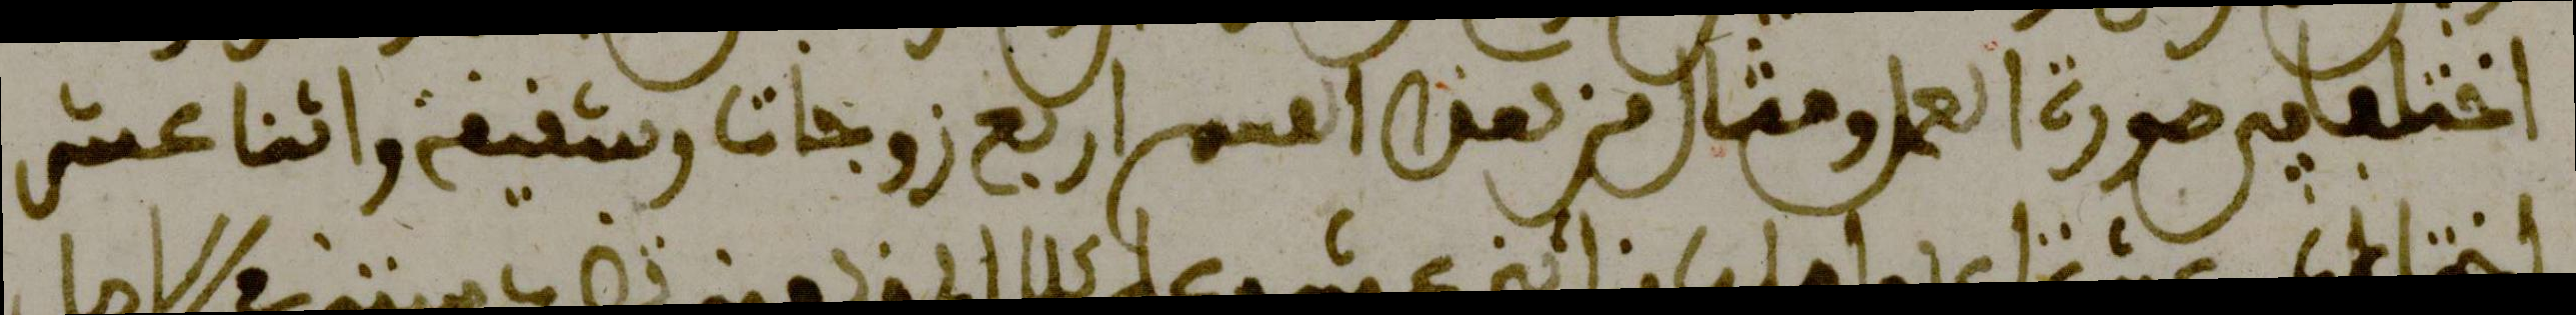اختلفا في صورة العمل ومثال من هذا القسم اربع زوجات وشقيقة واثنا عشر
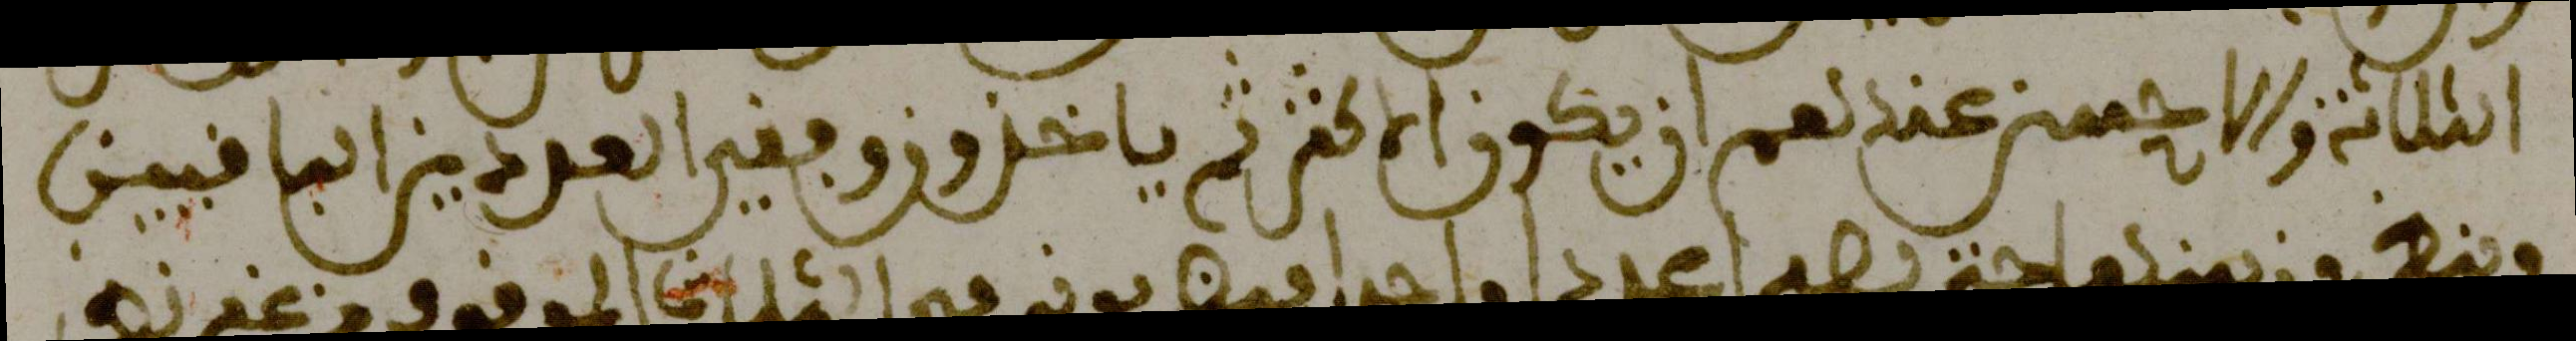الثلاثة والاحسن عندهم ان يكون الاكثر ثم ياخذون وفقي العددين الباقيين
